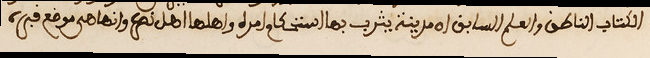الكتاب الناطق والعلم السابق ان مدينة يثرب بها استحكام امره واهلها اهل نصرى وانها هى موضع قبره
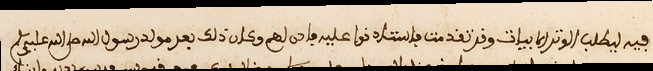فيه ليطلب الوتر الابيات وقد تقدمت فاستادنوا عليه فادن لهم وكان ذلك بعد مولد رسول الله صلى الله عليه وسلم
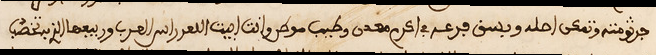جرثومته وتمكن اصله وبسق فدعه في اكرم معدن وطيب موطن وانت ابيت اللعد راس العرب وربيعها الذي به تخصب
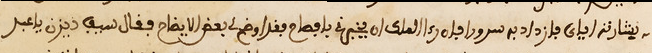يشارته اياى فازداد به سرورافان رءا الملك ان يخبر في بافصاح فقد اوضح لي بعض الايضاح فقال سيف ديزن يا عبد
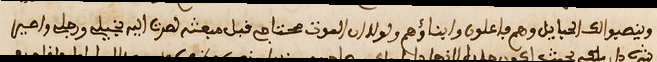وينصبوا لك الحبايل وهم فاعلون وابناؤهم ولولاان الموت محتاجى قبل مبعثه لصرت اليه نجيلى ورجلى واصير
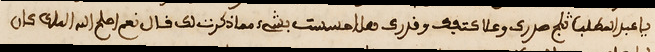يا عبد المطلب ثلج صدرك وعلا كتفك وقدرك هل احسست بشىء مما ذكرت لك قال نعم اصلح الله الملك كان
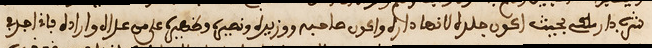شرب دار ملكى بحيث اكون جلده لانها داره واكون صاحبه ووزيره ونصيره وظهيره على من عداه واراده فاني اجد في
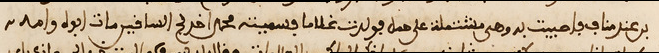بن عند مناف فاحبيت به وهى مشتملة على حمل فولدت غلاما فسميته محمدا خدلج الساقين مات ابوه وامه
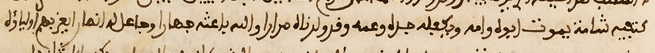كتفيه شامة يموت ابوه وامه ويكفله جده وعمه وقد ولدناه مرارا والله باعثه جهارا وجاعل له انصارا يعز بهم اولياؤه
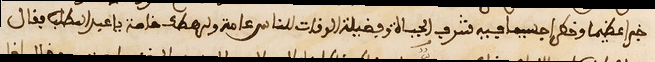خبر اعظيما وخطر اجسيما فيه شرف الحياة وفضيلة الوقات للناس عامة ولرهطك خاصة يا عبد المطلب فقال
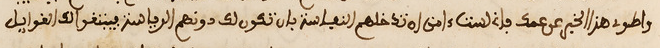واطوى هذا الخبر عن عمك فاني لست ءامن ان تدخلهم النفاسة بان تكون لك دونهم الرياسة فيبتغوا لك الغوايل
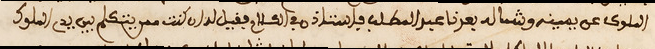الملوك عن يمينه وشماله بعدنا عبد المطلب فاستاذه في الكلام فقيل له ان كنت ممن يتكلم بين يدى الملوك
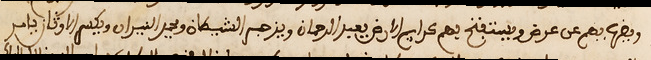ويقرب بهم عن عرض ويستفتح بهم كرايم الارض يعبد الرحمان ويزجر الشيطان ويحمد النيران ويكسر الاوثان يامر
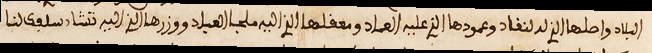البلاد واصلها الذي له لنغاد وعمودها الذي عليه العماد ومعقلها الذي اليه ملجا العباد ووزرها الذي اليه تشاد سلفك لنا
